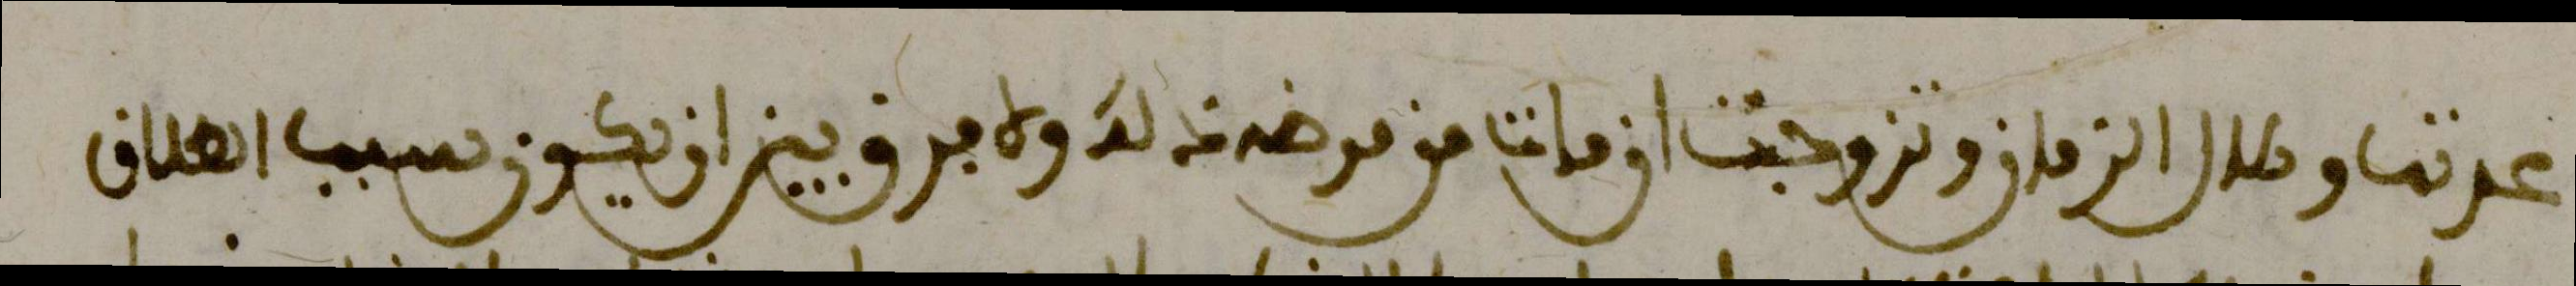عدتهاو طال الزمان و تزوجت ان مات من مرضه ذلك و لا فرق بين ان يكون سبب الطلاق
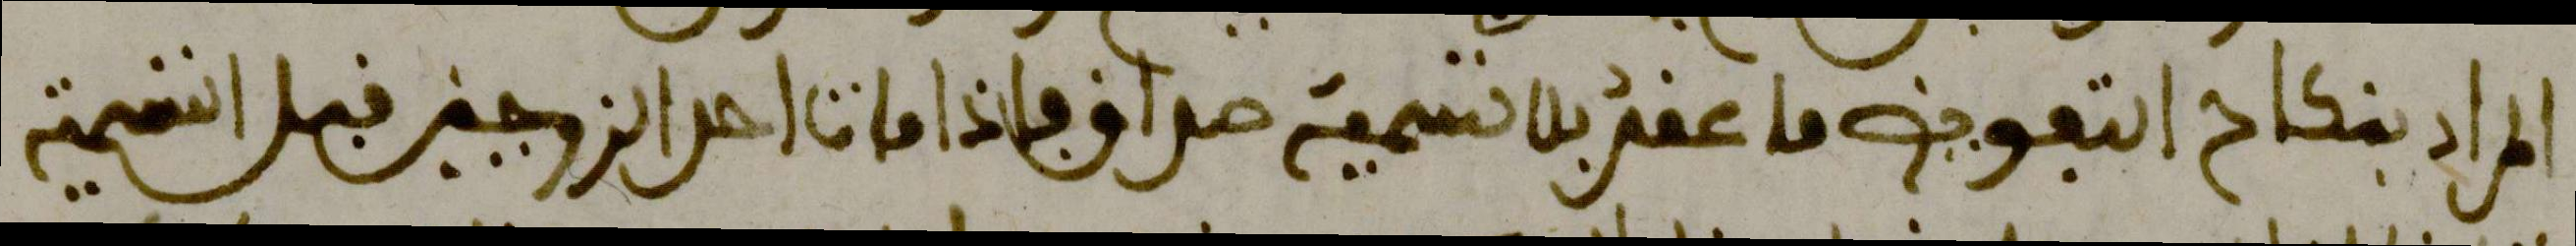المراد بنكاح التفويض ما عند بلا تسمية صداق فاذا مات احد الزوجين قبل التسمية
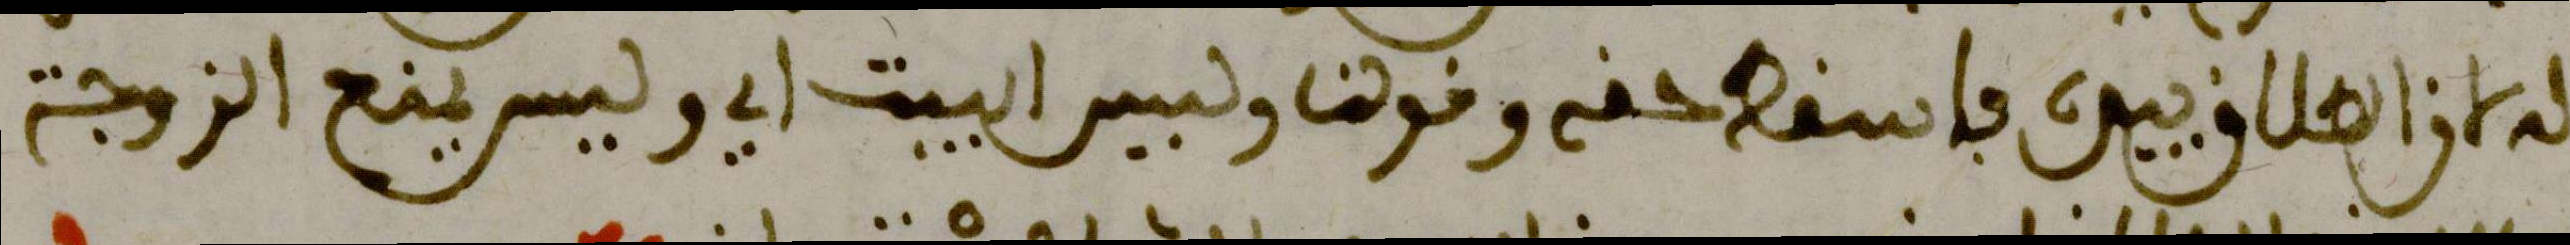له لان الطلاق بيده فاسقط حقه و قولنا و ليس البيت اي و ليس يمنع الزوجة
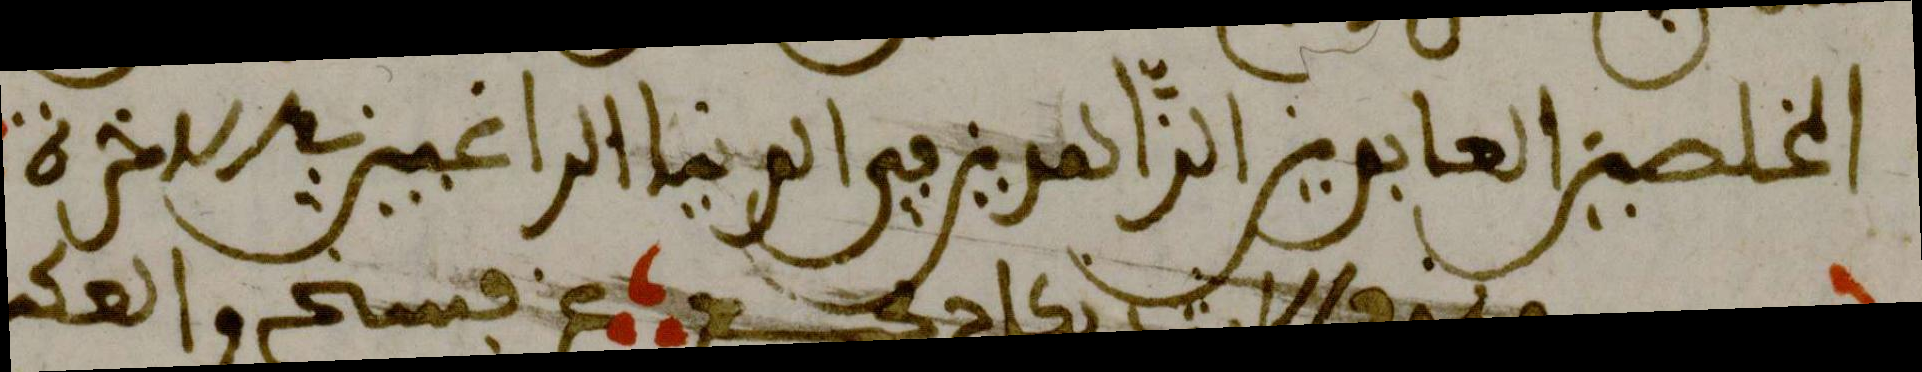المخلصين العابدين الزّاهدين في الدنيا الراغبين في الاخرة
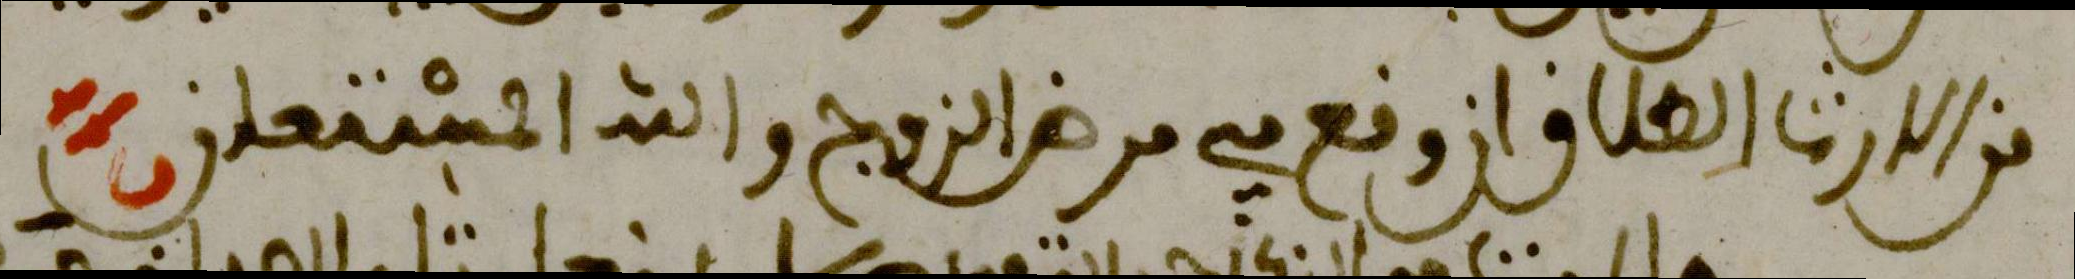من الارث الطلاق ان وقع في مرض الزوج و الله المستعان
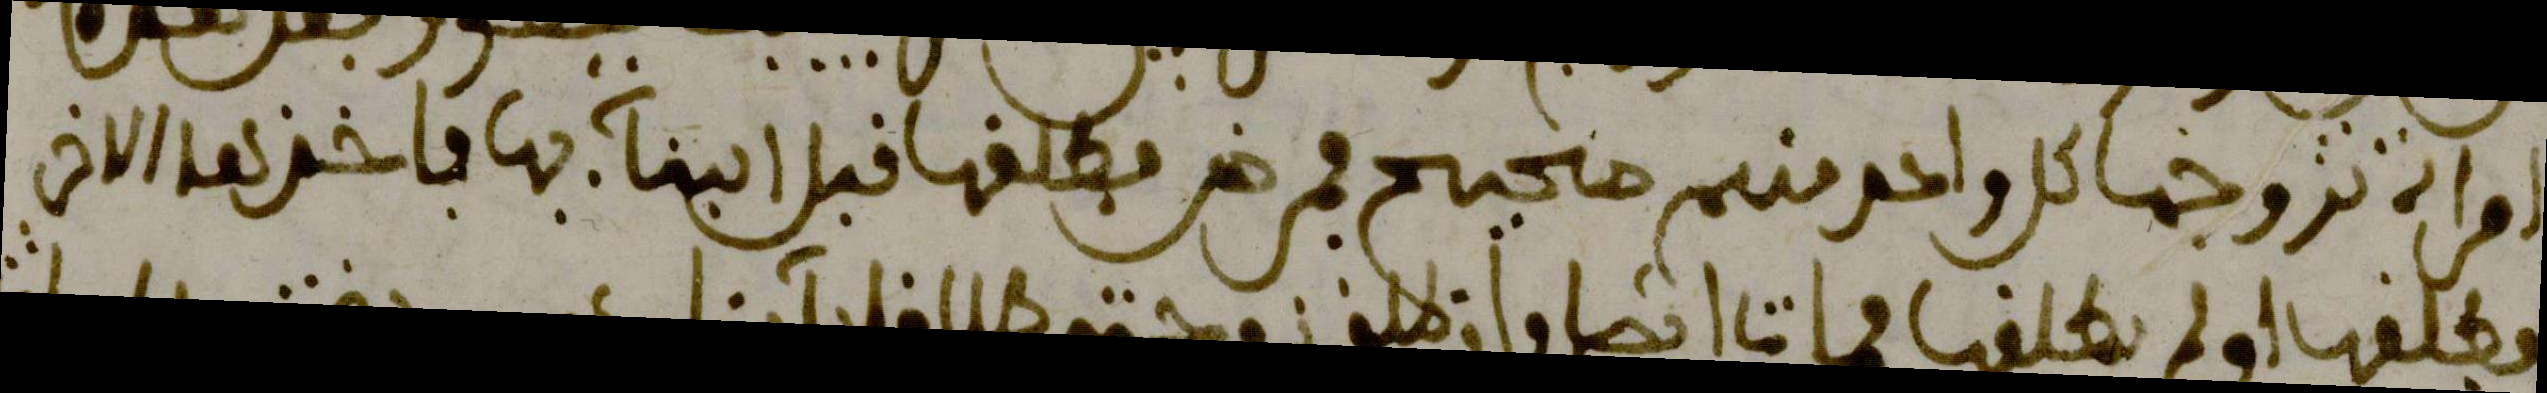امراة تزوجها كل واحد منهم صحيح فمرض فطلقها قبل البناء بها فاخذها الاخر
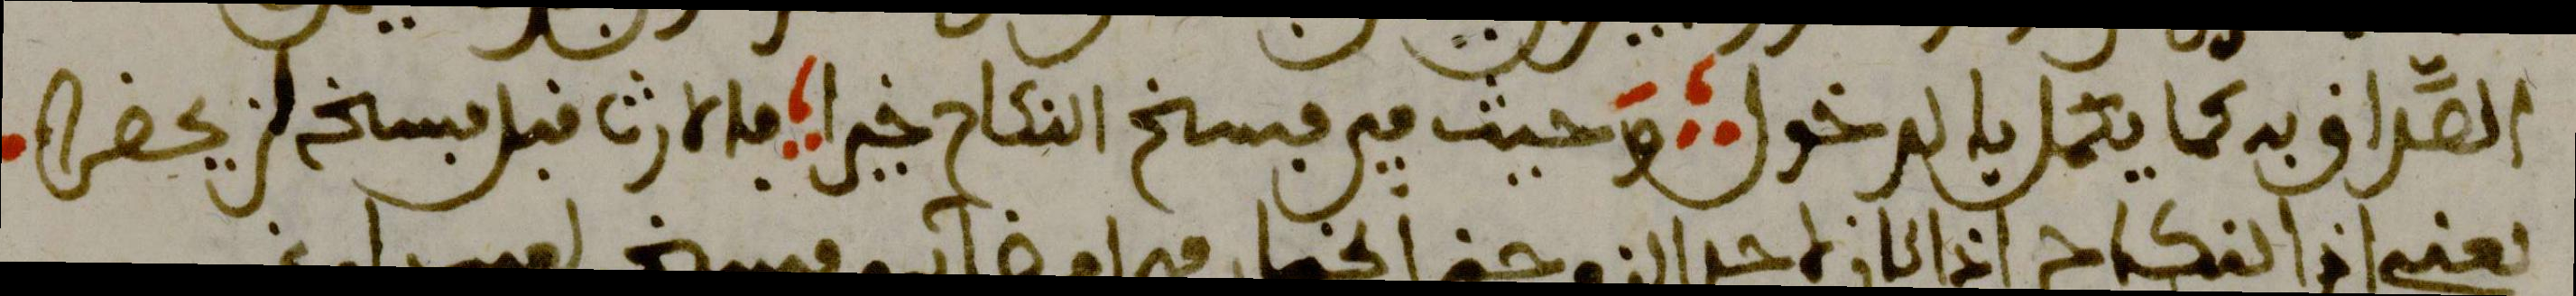الصّداق به كما يكمل بالدخول و حيث في فسخ النكاح خيرا فالارث قبل فسخه لن يحضرا
